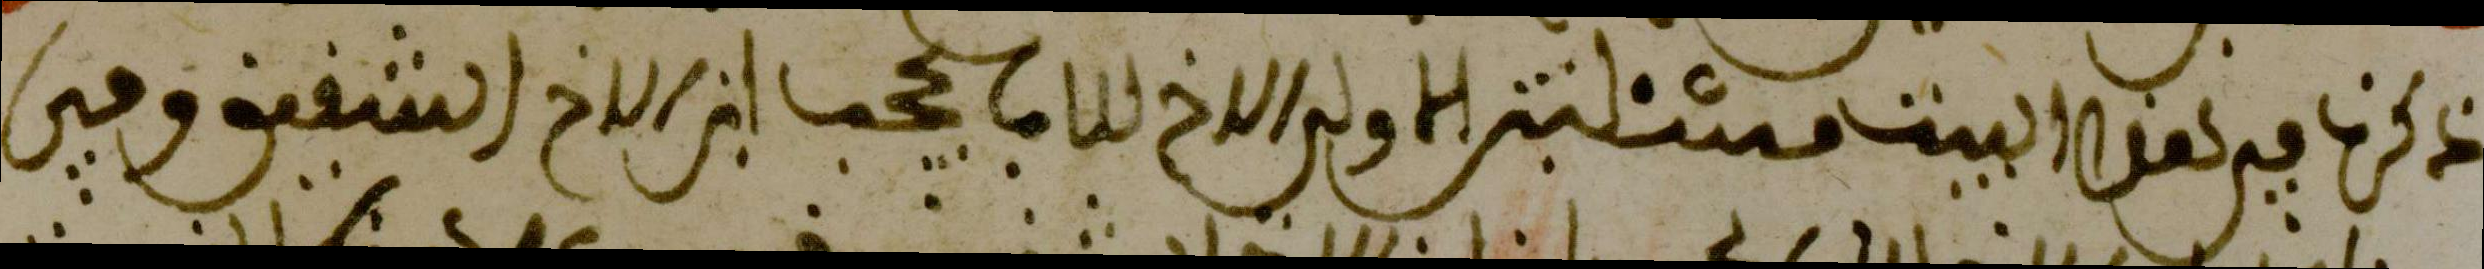ذكرن في هذا البيت مسئلتين الاولى الاخ للاب يحجب ابن الاخ الشقيق وفي
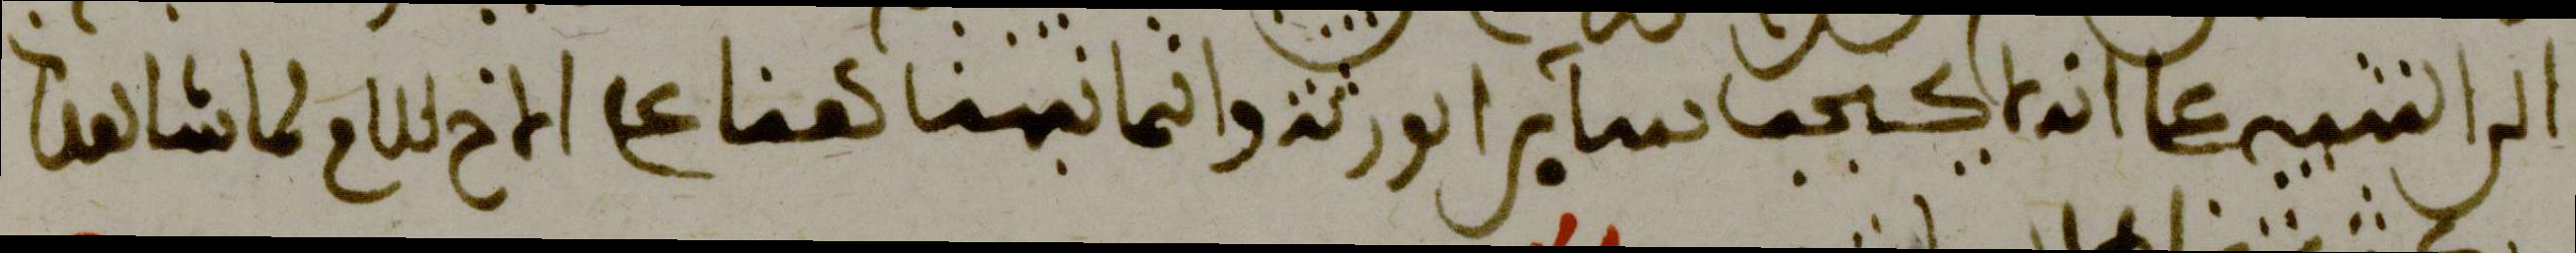الى التنبيه على انه لا يحجب سائر الورثة وانما نبهنا هنا على الاخ للام لما شاهدن
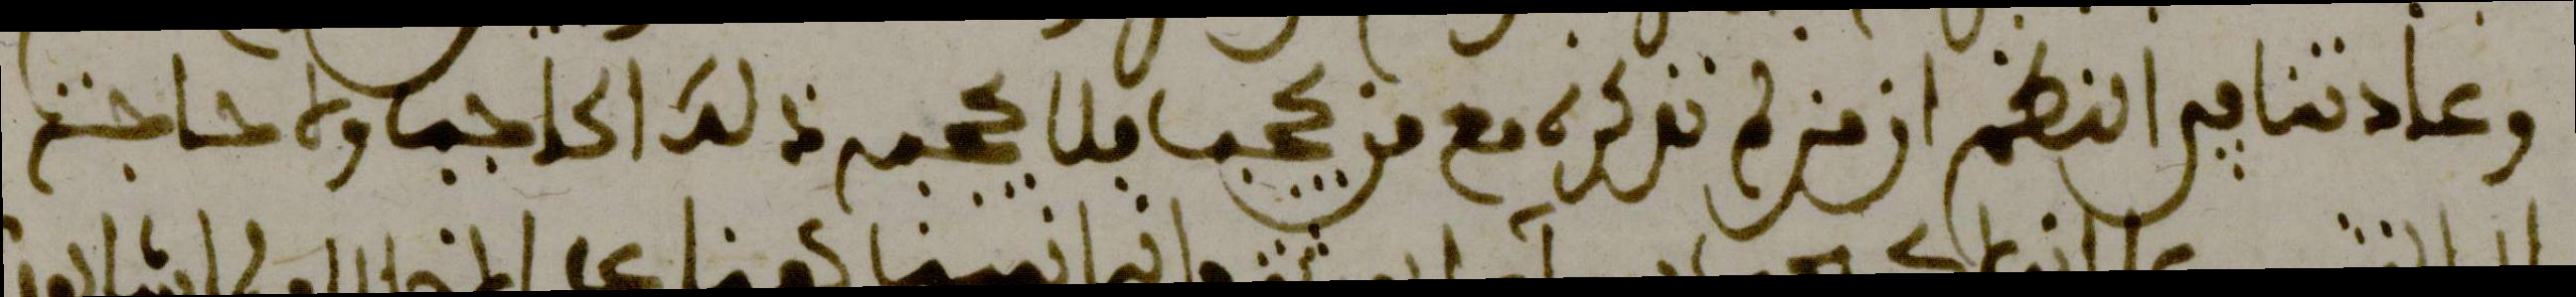وعادتنا في النظم ان من لم نذكره مع من يحجب فلا يحجبه ذلك الحاجب ولا حاجة
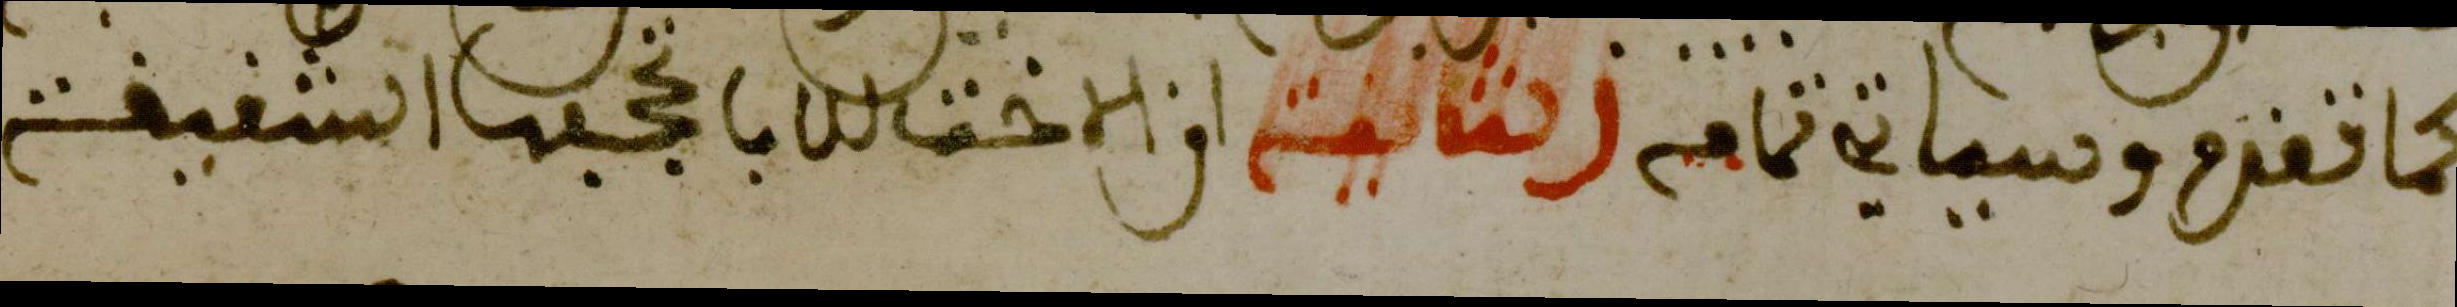كما تقدم وسياتي تمامه الثانية ان الاخت للاب تحجبها الشقيقة
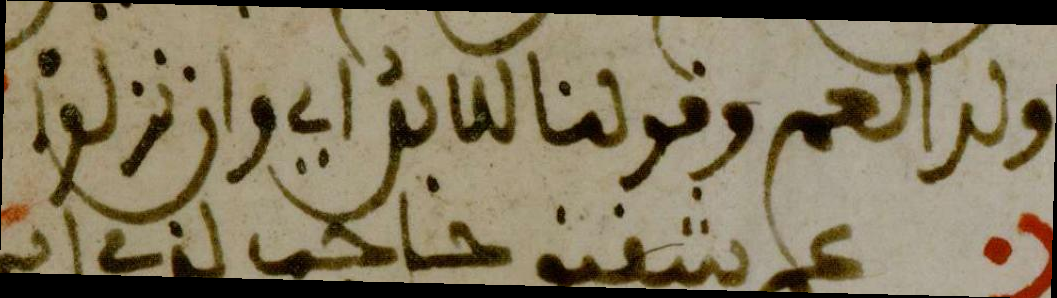ولد العم وقولنا للابد اي وان نزلوا
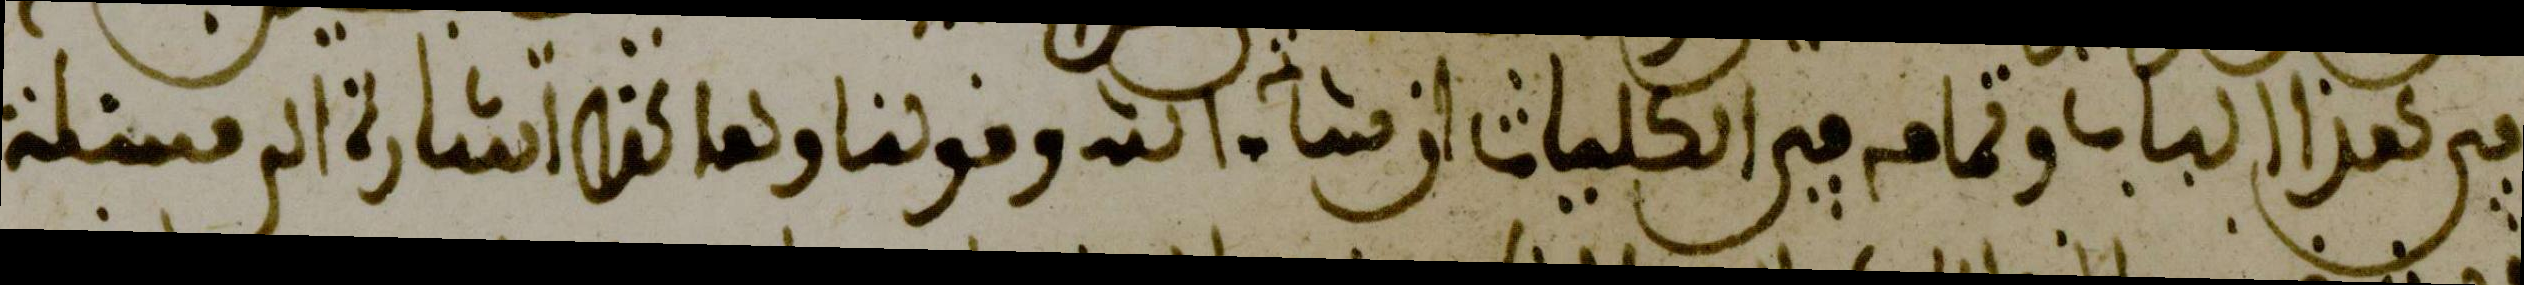في هذا الباب وتمامه في الكليات ان شاء الله وقولنا وهاكذا اشارة الى مسئلة
